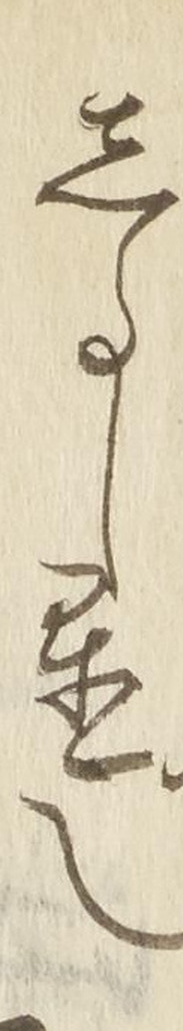しるし置也
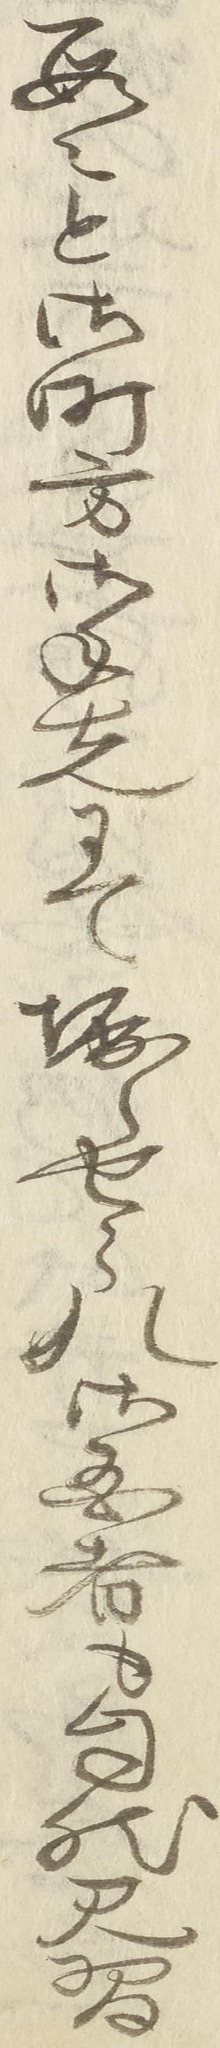段々と御町方御手先にて掘らせられ御国者も自然見習

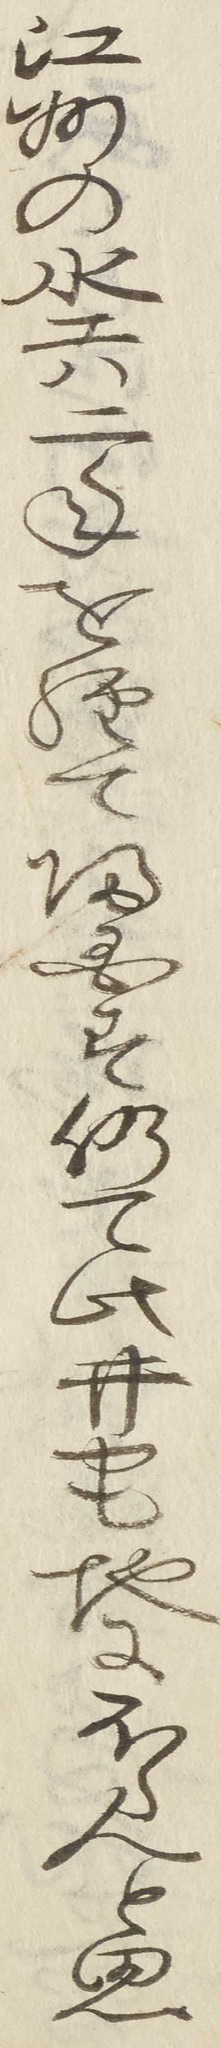江州の水工は二年を経て帰国す仍て此井宅地にほらんと思
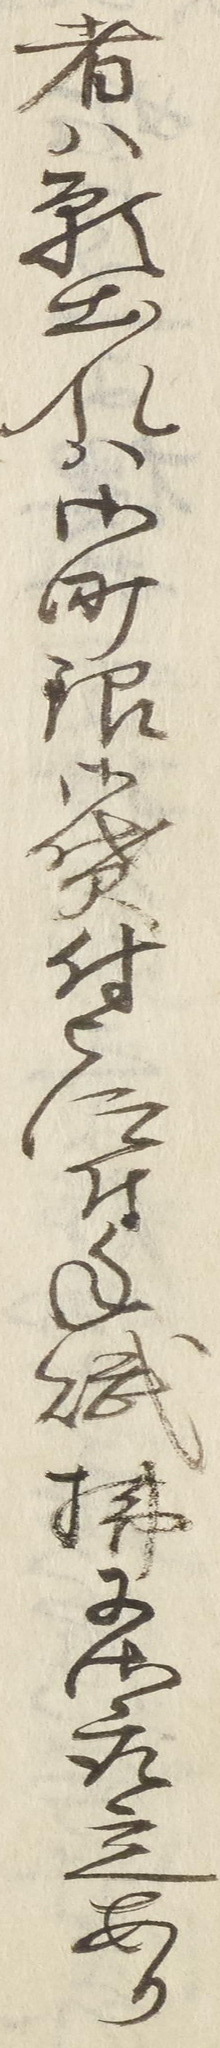者は願出れは御町銀御貸付被仰付年賦払に御取立あり
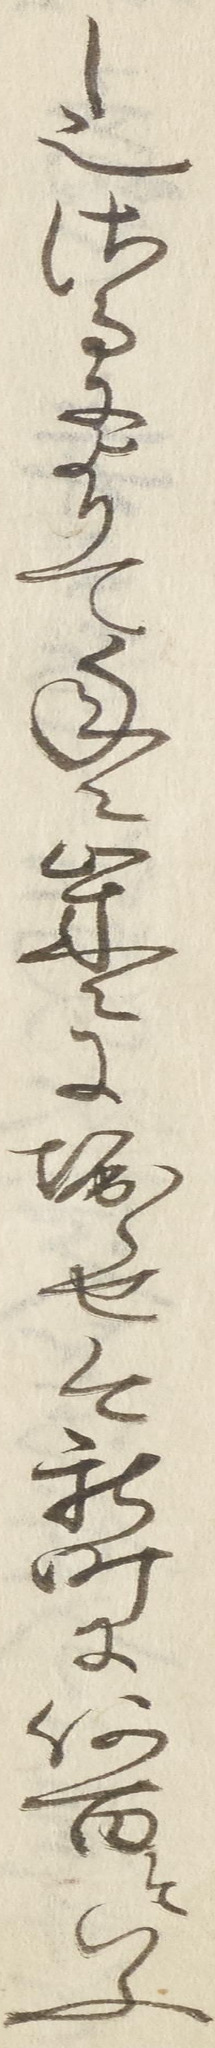し也さるによりて年々歳々に掘らせ今新町に何百といふ
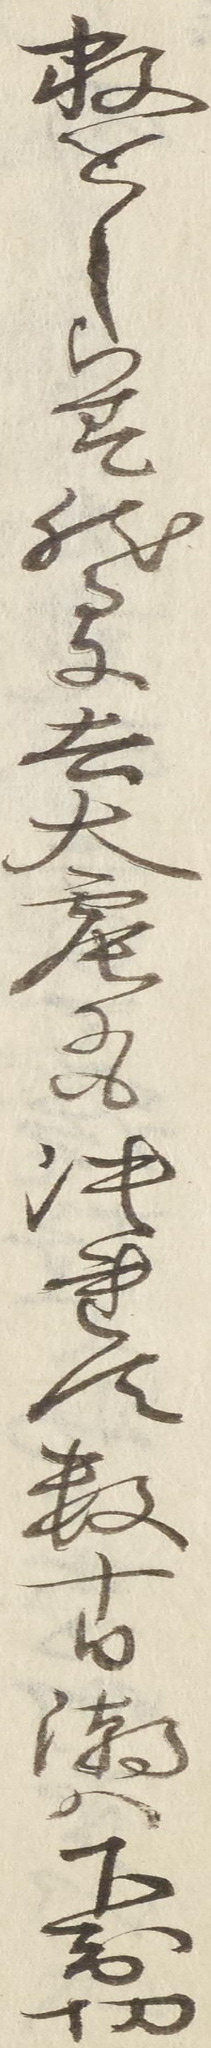数をしらす然るに去大震にも潰れす数十日潮は下知切
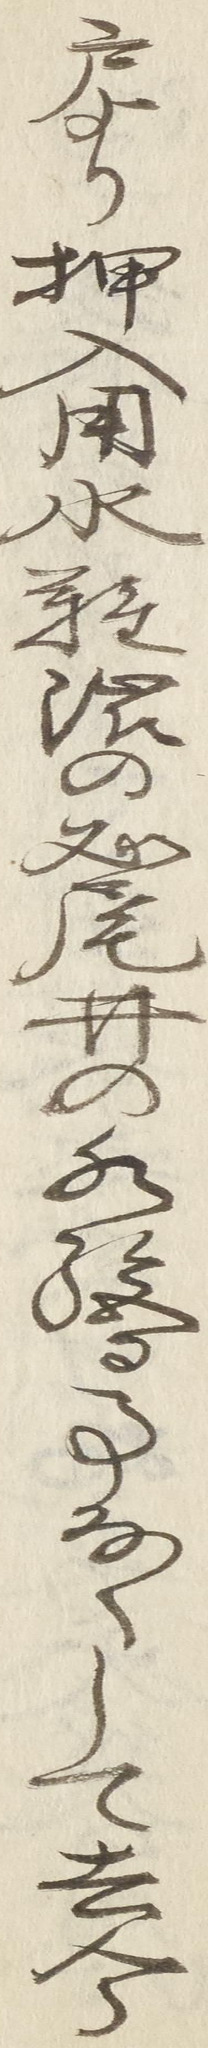戸より押入用水難渋の所尾井の水絶る事なくして去今
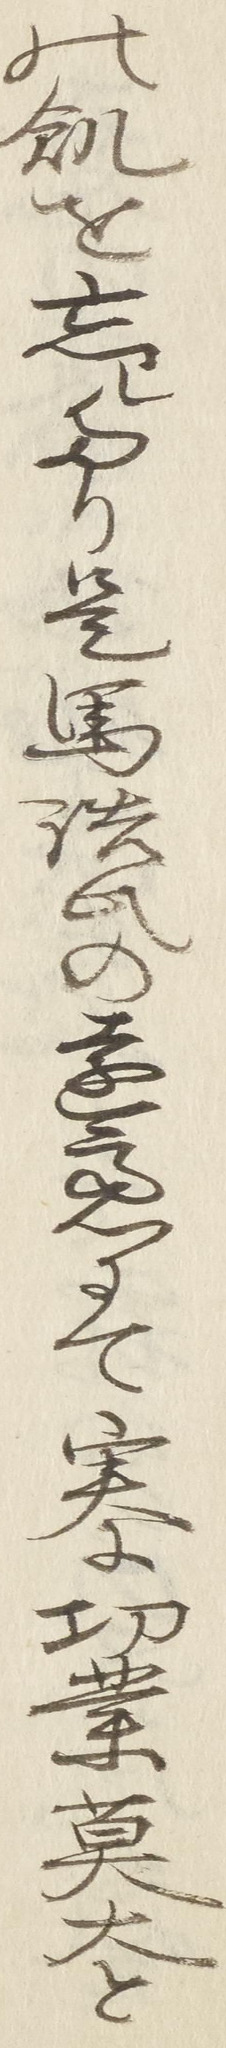の飢を忘れたり是馬詰氏の遠慮にて実に功業莫大と
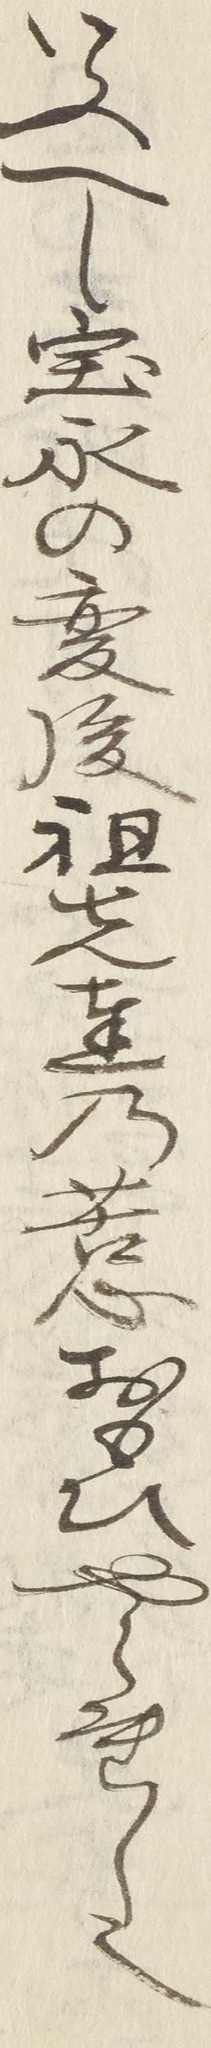いふへし宝永の変後祖先達の苦心おもひやられし也
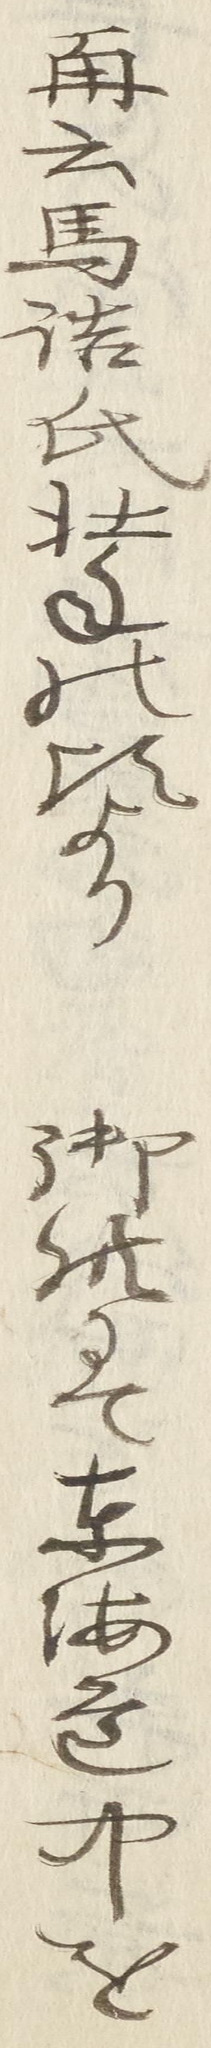再云馬詰氏壮年の頃より御供にて東海道中を
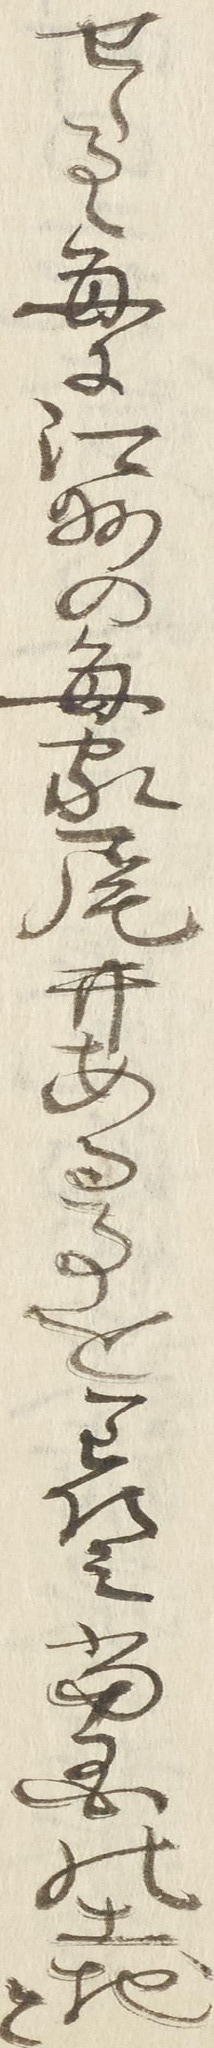せくるゝ毎に江州の毎家尾井ある事を尋し当国の土地と
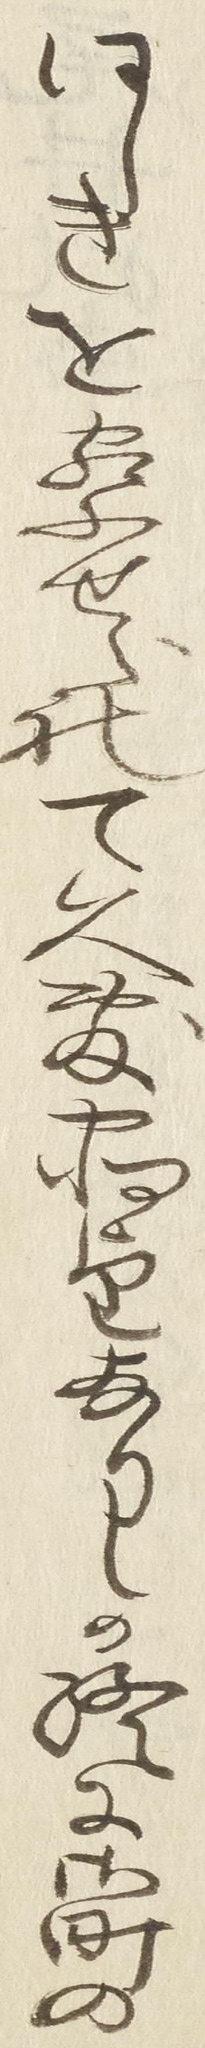同しきを察せられて久敷宿望ありしか終に御町の
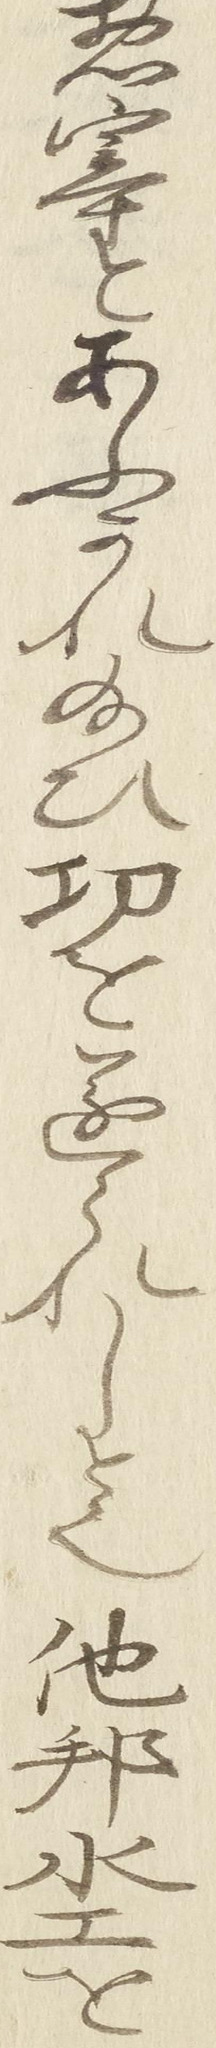惣宰とあふかれ為ひ功を遂られしと也他邦水工を
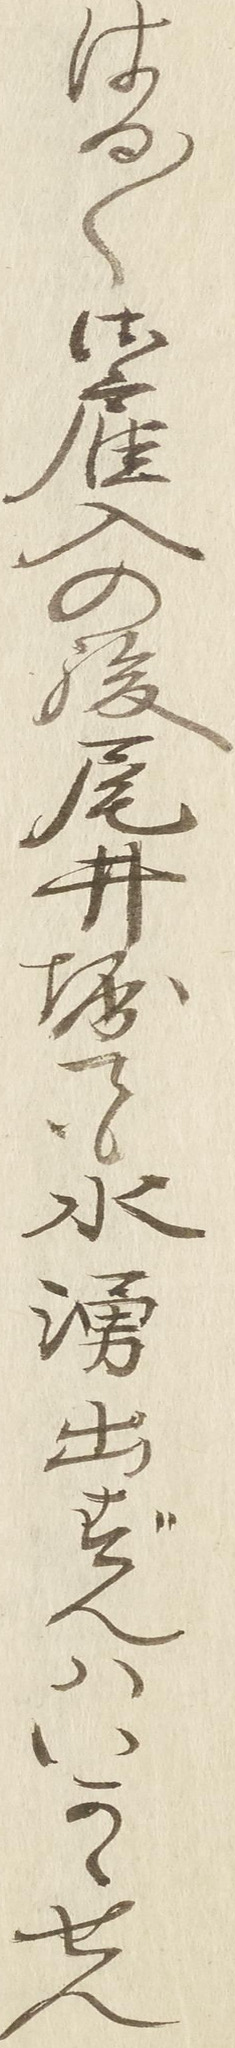はる〳〵御雇入の後尾井堀ても水湧出ずんはいかゝせん
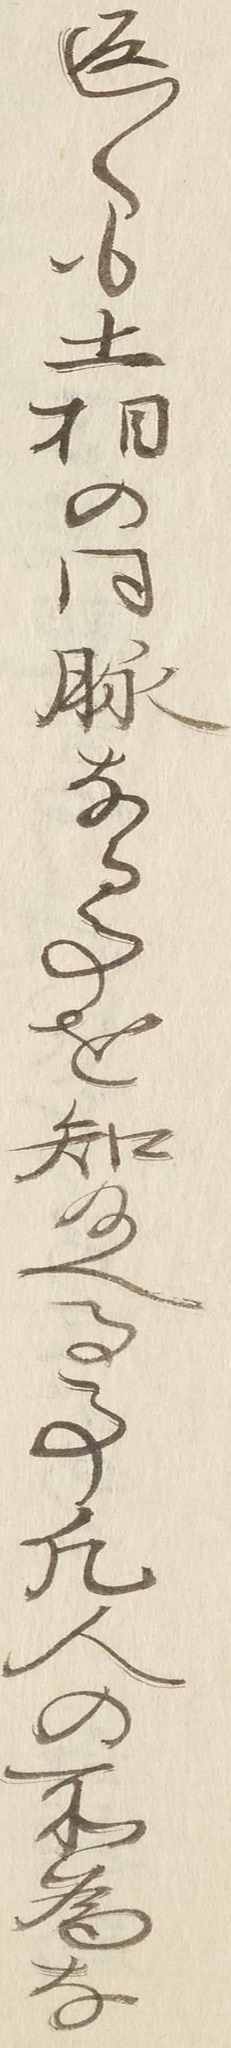返々も土相の同脉なる事を知為へる事凡人の所為な
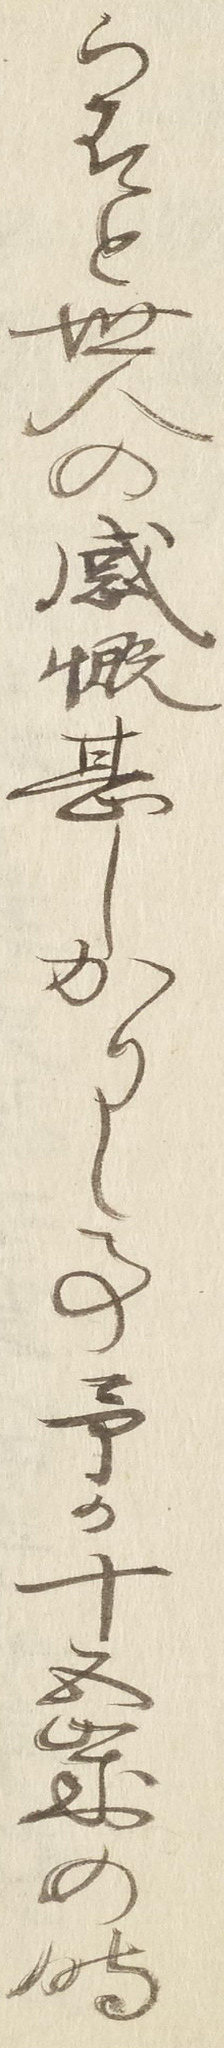らすと世人の感慨甚しかりし事予か十五歳の時
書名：地震記　上
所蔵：東京大学地震研究所図書室 Earthquake Research Institute Library, The University of Tokyo, JAPAN
